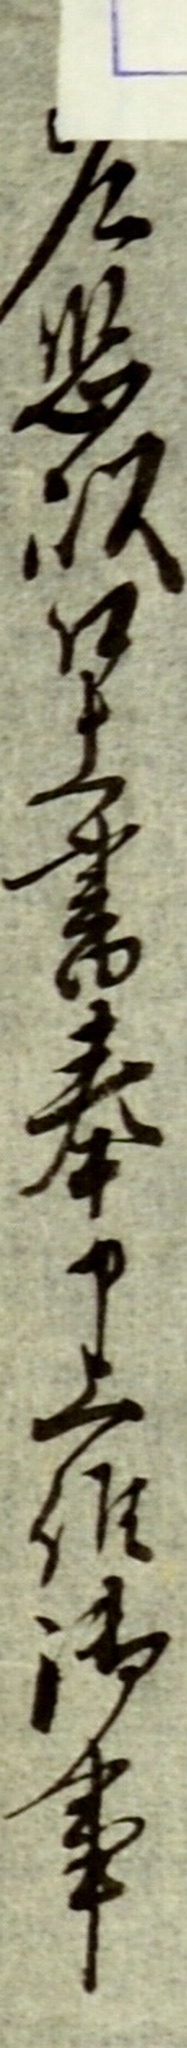乍恐以口上書奉申上候御事
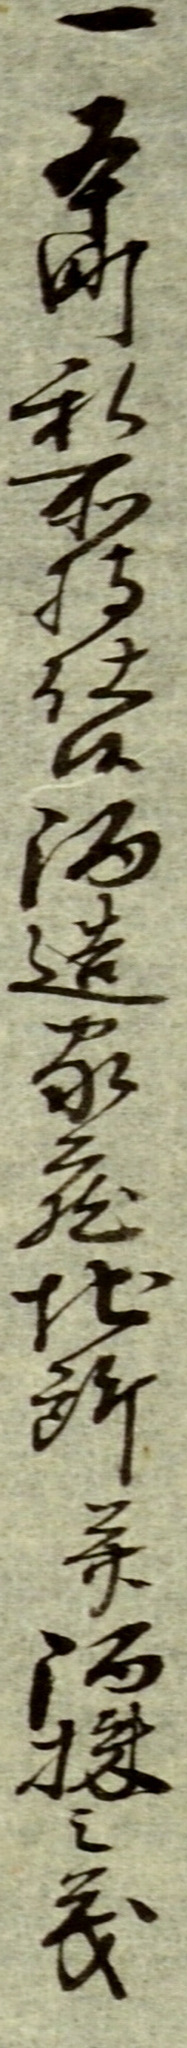一本町私所持仕候酒造家蔵地所并酒株之義
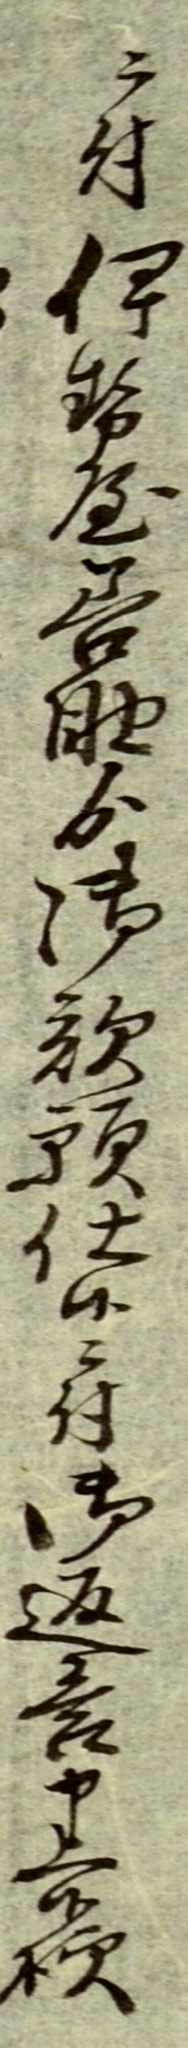ニ付伊勢屋善助ゟ御歎願仕候ニ付御返答申上候様
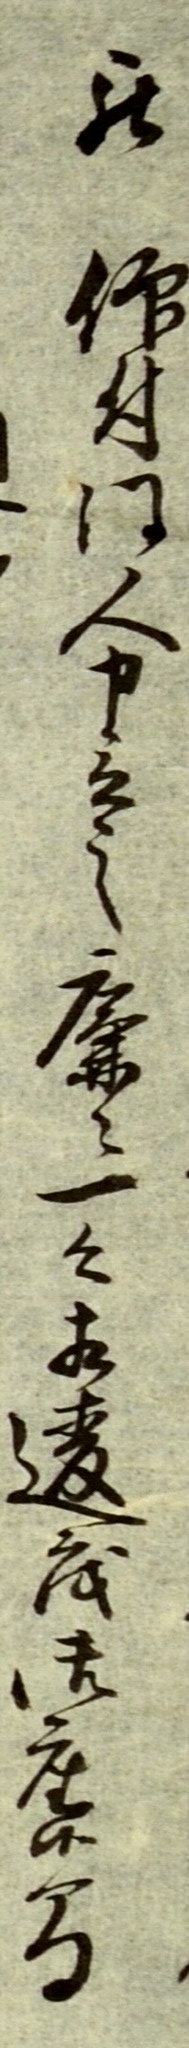被仰付同人申立之廉々一々相違茂御座候間
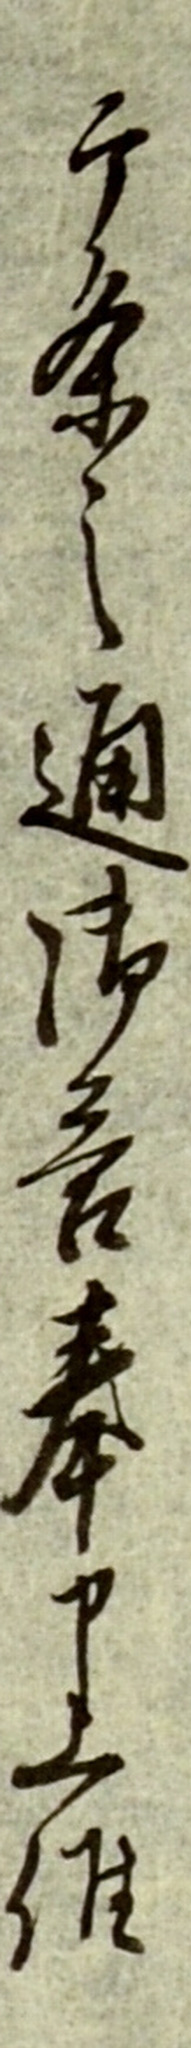ケ条之通御答奉申上候
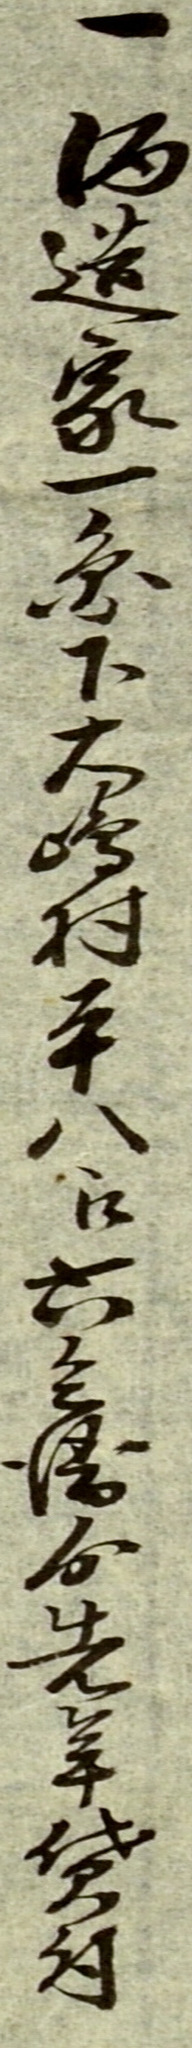一酒造家一円下大島村平八江六兵衛ゟ先年貸付
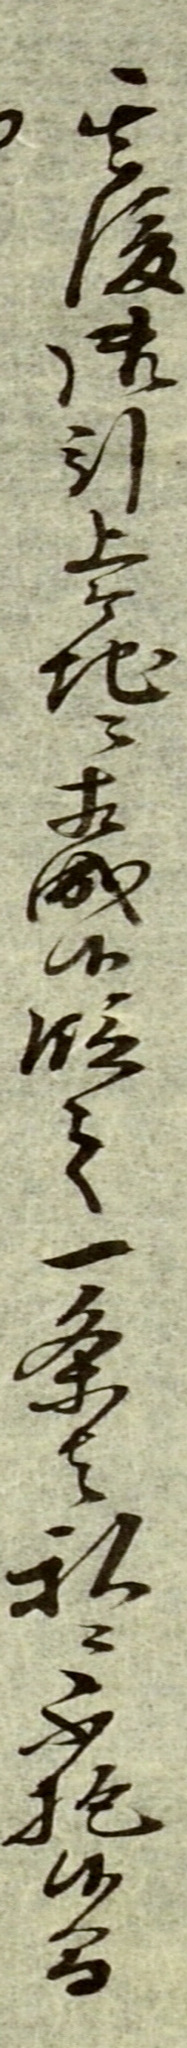其後御引上ケ地ニ相成候段之一条者私ニ不抱候間
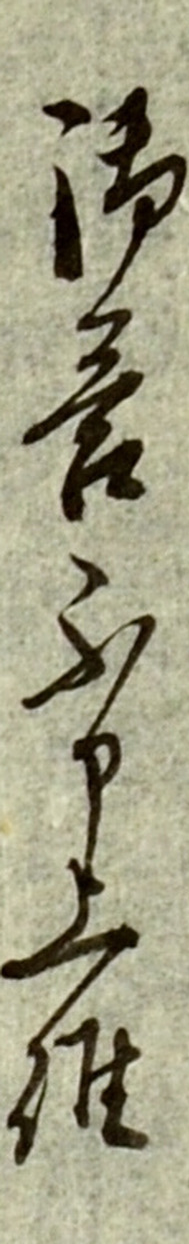御答不申上候
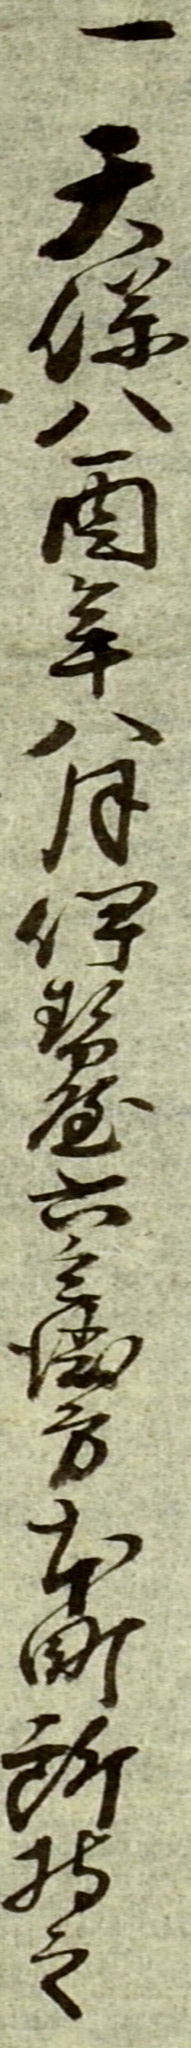一天保八酉年八月伊勢屋六兵衛方本町所持之
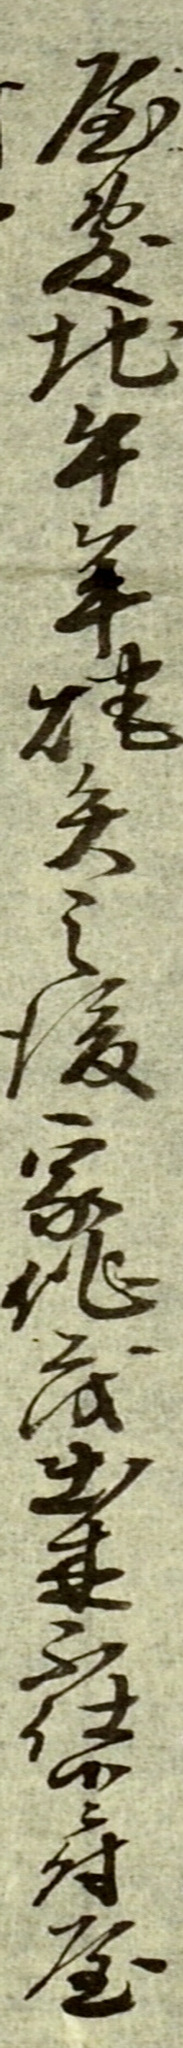屋敷地午年焼失之後家作茂出来不仕ニ付屋
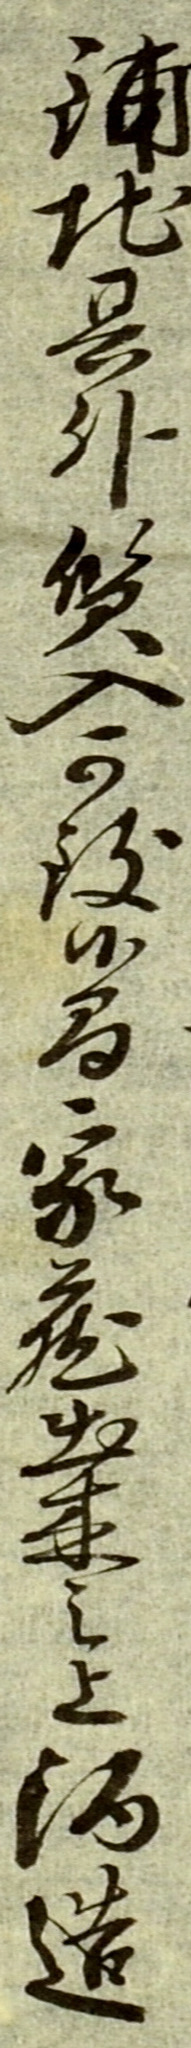鋪地其外質入可致候間家蔵出来之上酒造
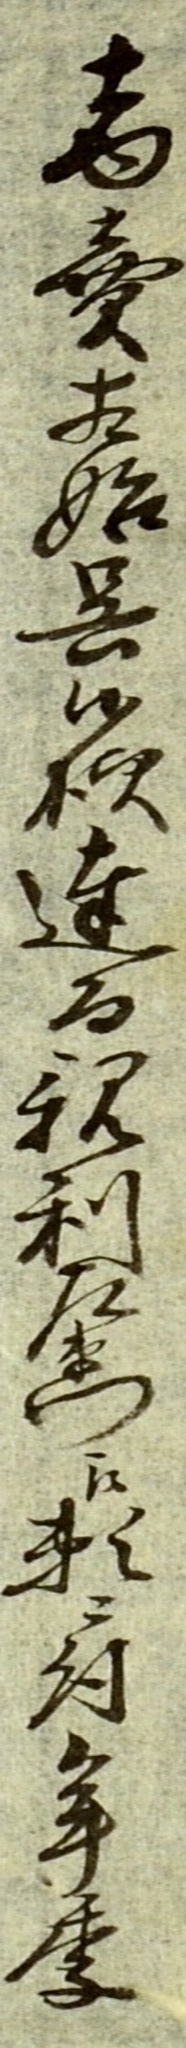商売相始呉候様達而親利右衛門江願ニ付年季
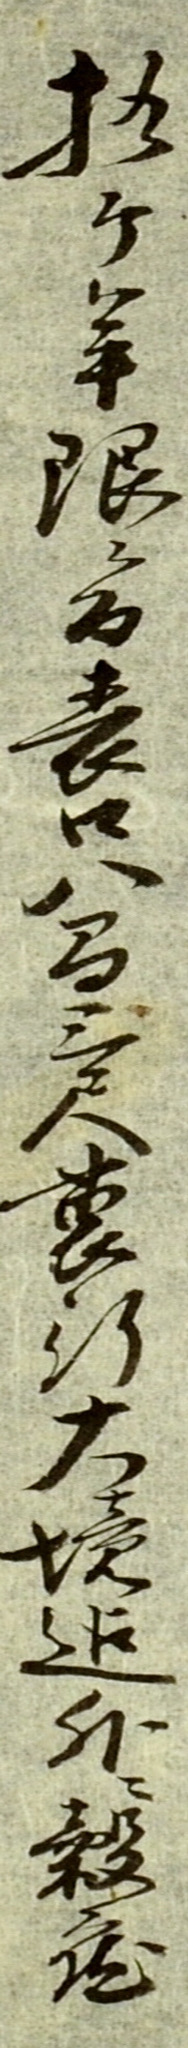拾ケ年限ニ而表口八間三尺裏行大境迄外ニ穀屋
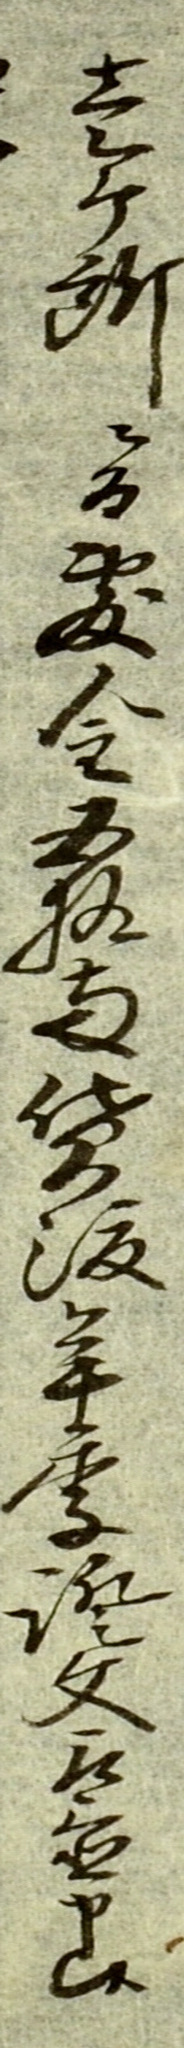壱ケ所ニ而敷金五拾両貸渡年季証文取置申候
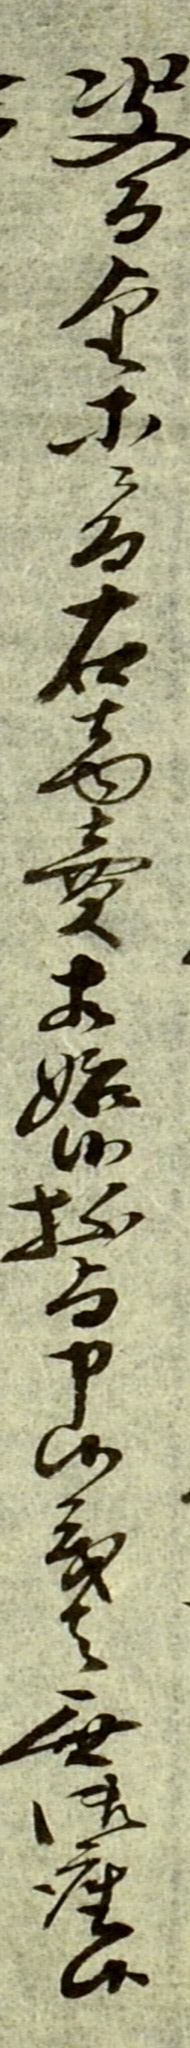決而望等ニ而右商売相始候抔と申候義者無御座候
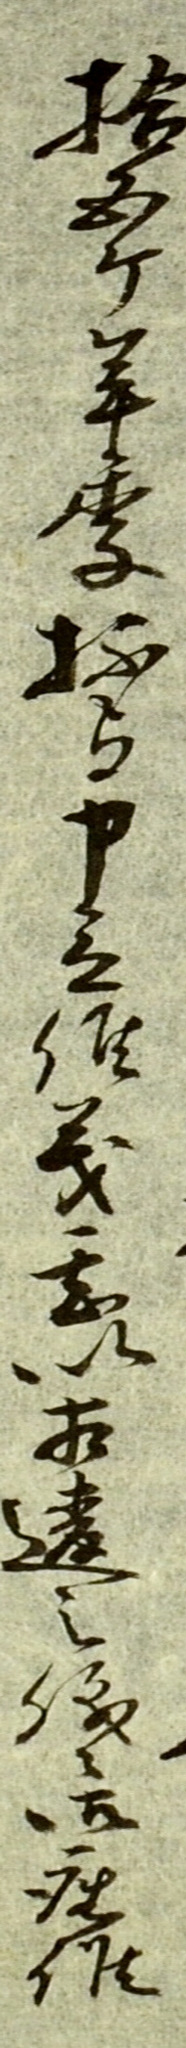拾五ケ年季抔と申立候義甚以相違之義ニ御座候
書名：乍恐以口上書奉申上候御事
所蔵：伊那市立高遠町図書館・合同会社AMANE
